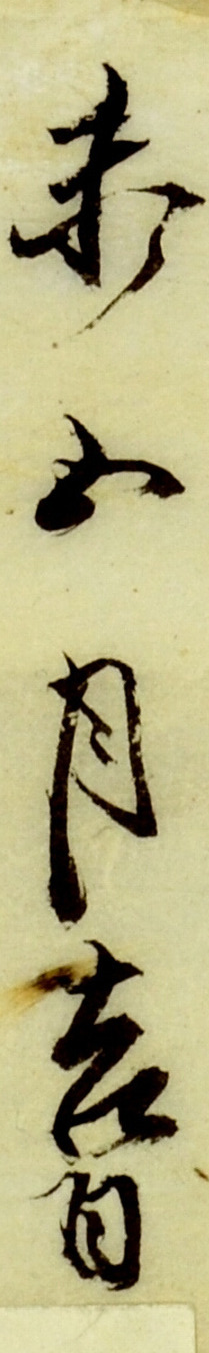未五月吉日

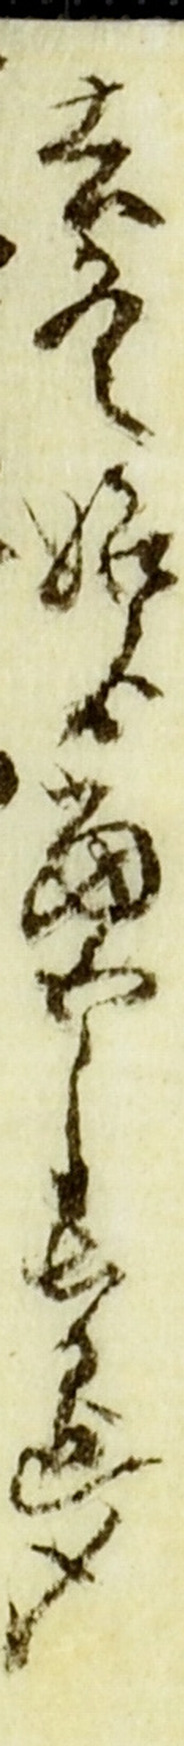去冬始ゟ当五月七日迄〆
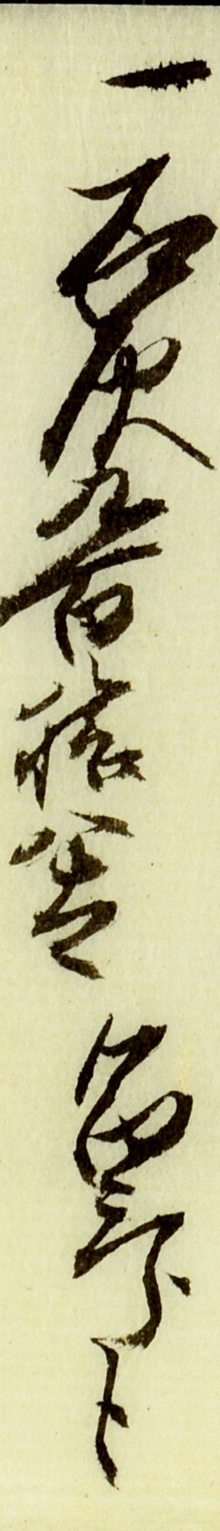一石灰九百八拾八太富三郎分
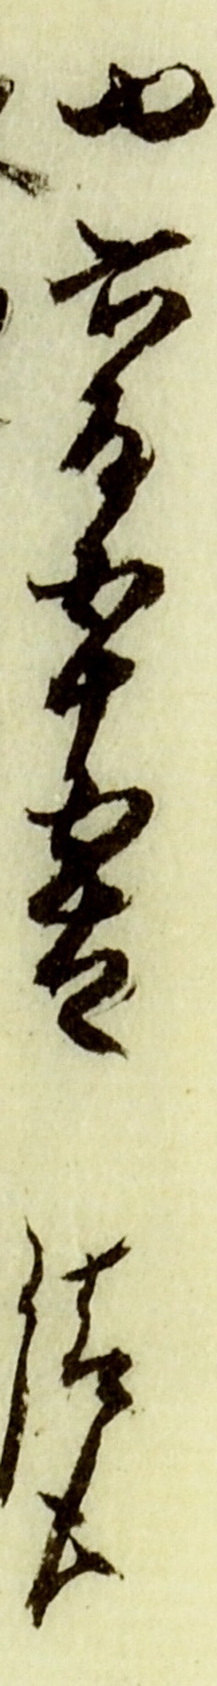内六百五十五太請取
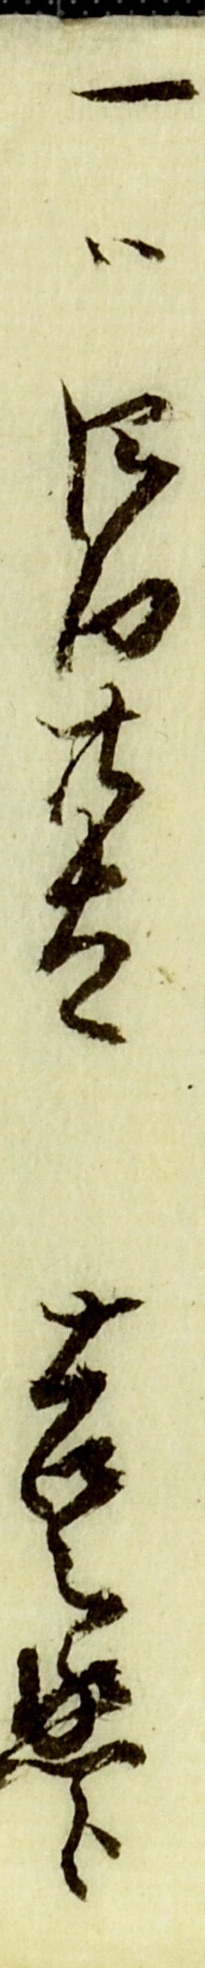一同四百廿太久弥分
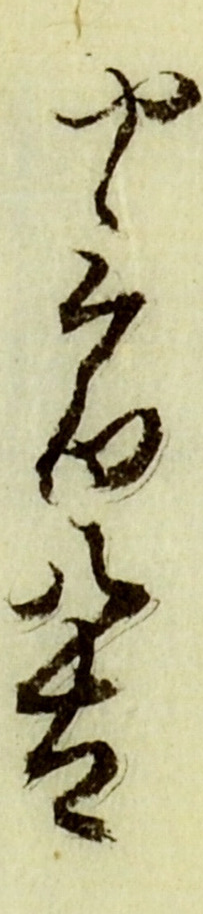内三百八太
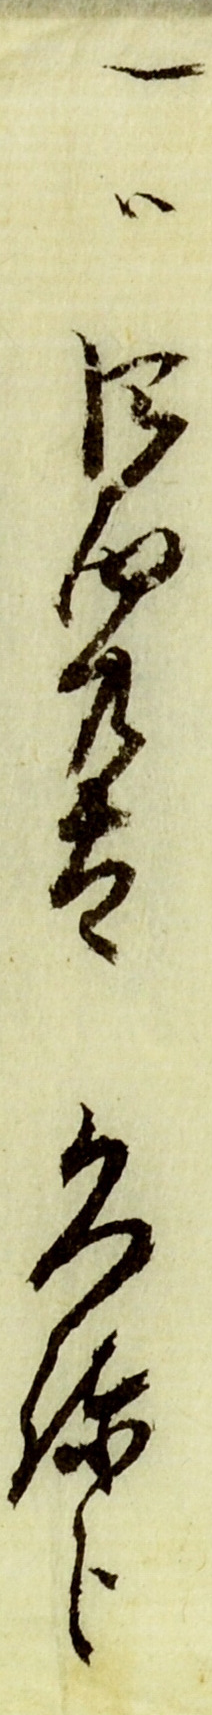一同四百廿太久弥分

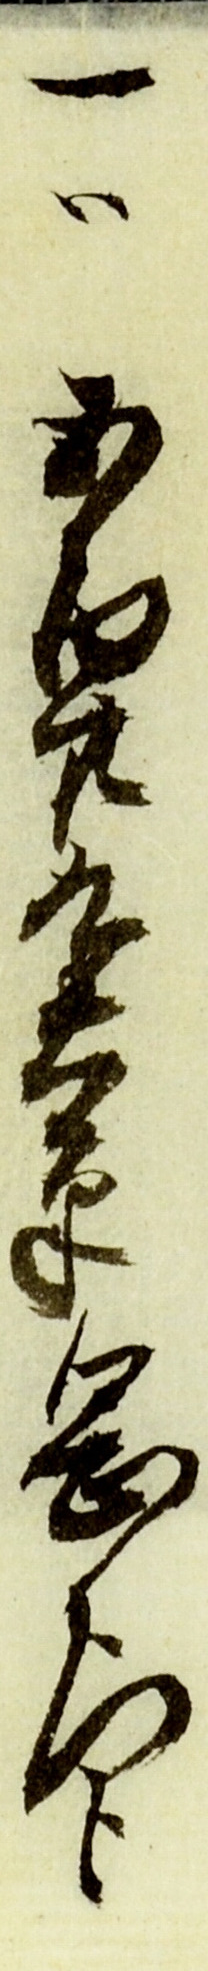一同五百廿九太半岡右衛門分
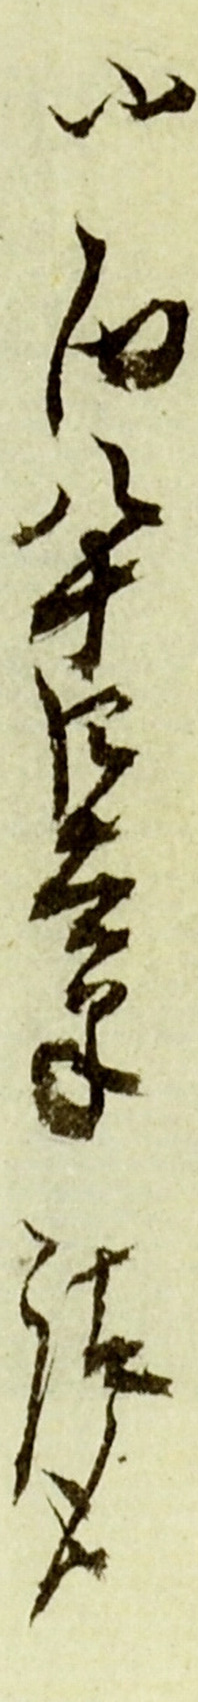内百八十四太半請取
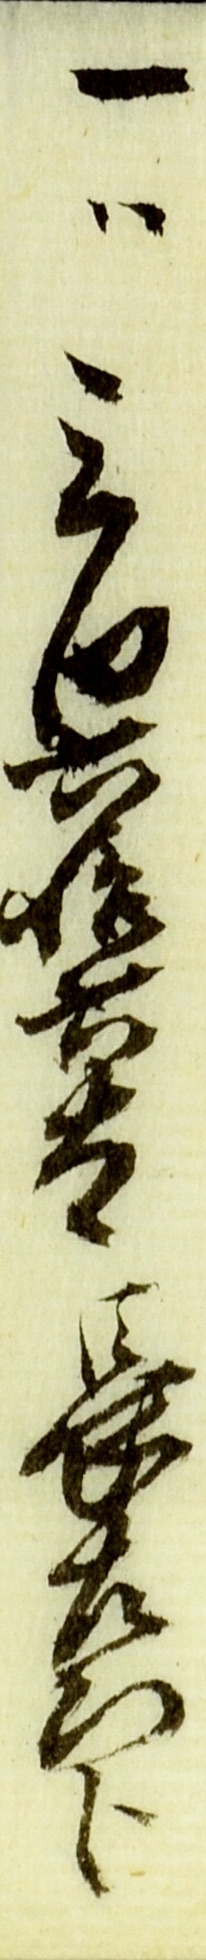一同三百六拾六太長左衛門分
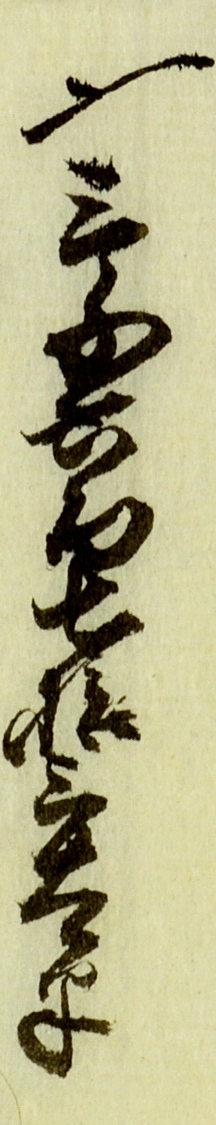〆三千六百七拾三太半
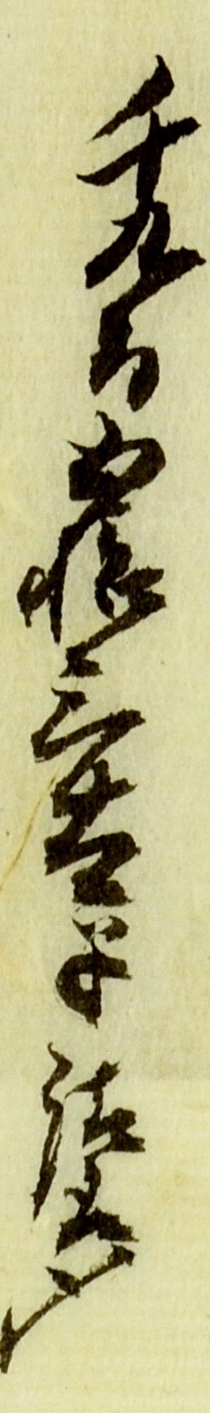千九百五拾三太半請取〆

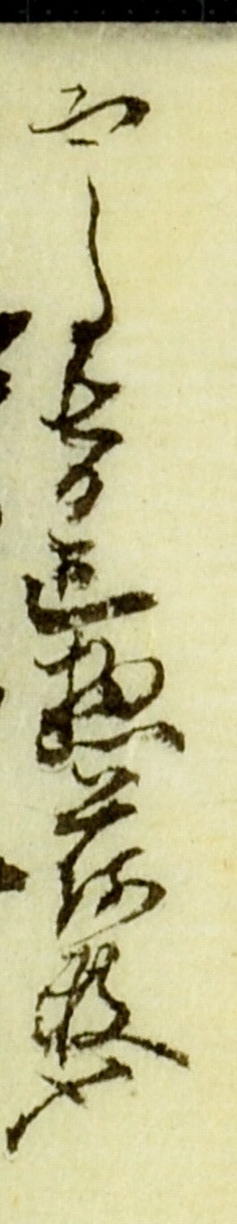五月七日迄惣荷数〆
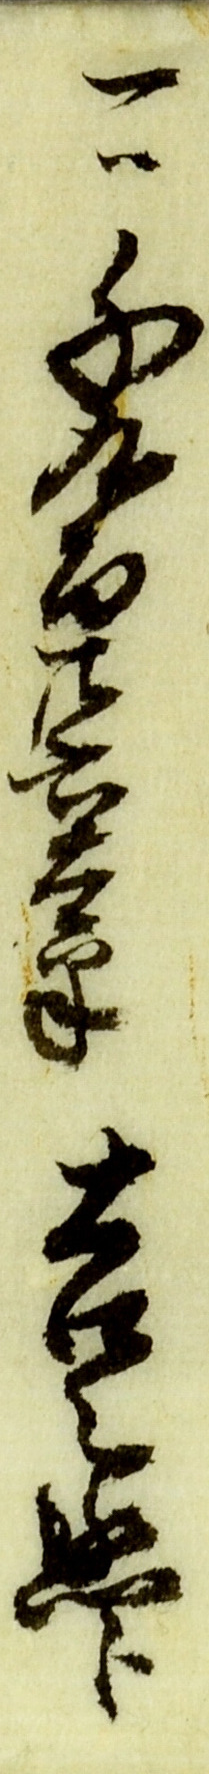一同千九百廿六太半吉之丞分
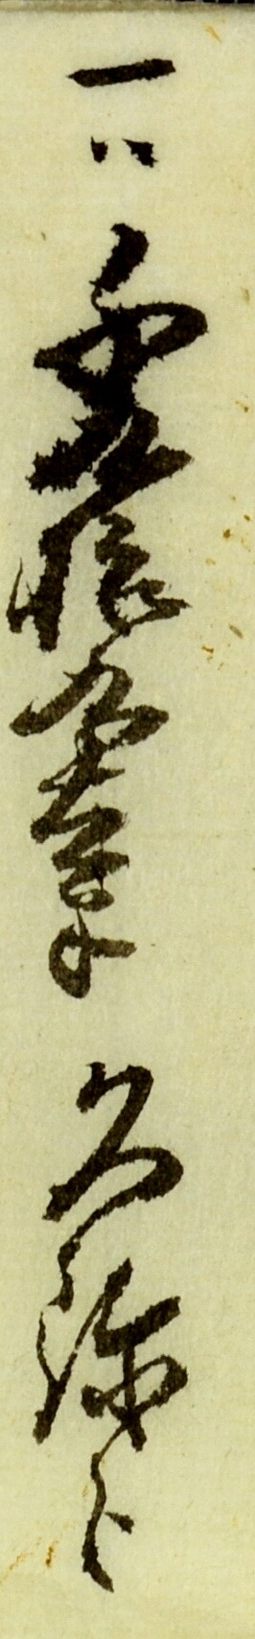一同千九拾九太半久弥分

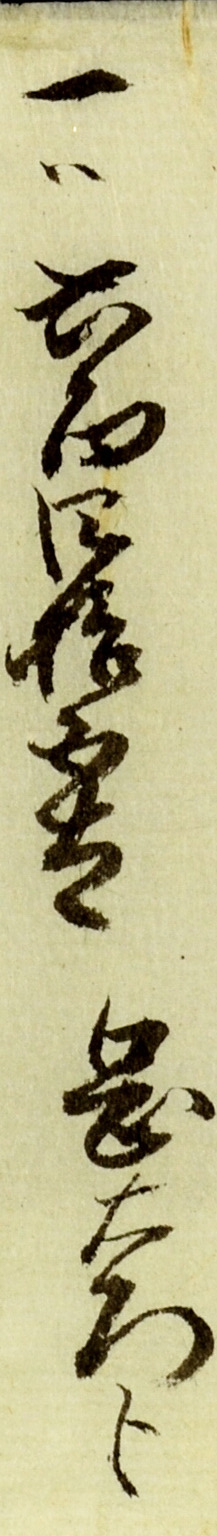一同六百四拾五太岡右衛門分
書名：石灰荷数并請取荷調帳
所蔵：伊那市立高遠町図書館・合同会社AMANE
